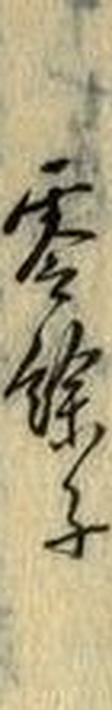零餘子
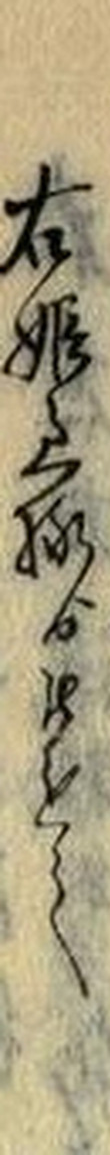右姫君様ゟ被進之
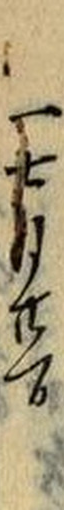一七月廿一日
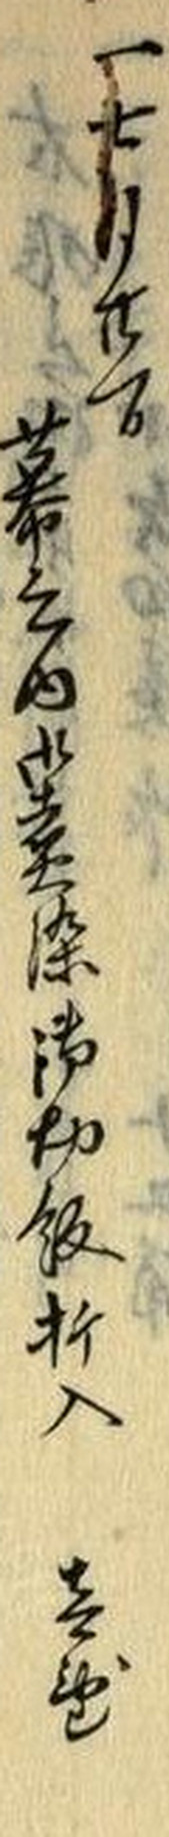幕之内御煮染御切飯折入壱台
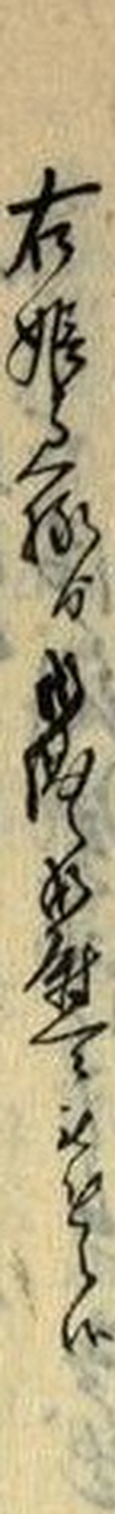右姫君様ゟ御側へ御慰ニ被進之候
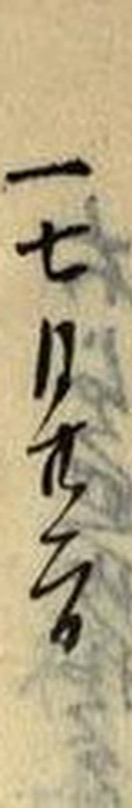一七月廿二日
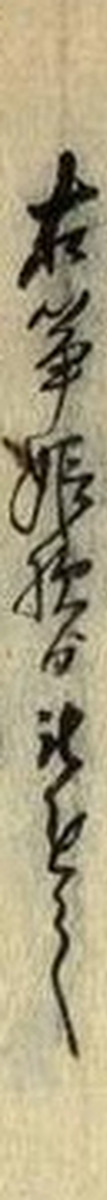右箏姫様ゟ被進之
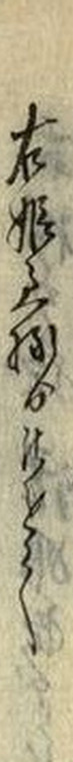右姫君様ゟ被進之
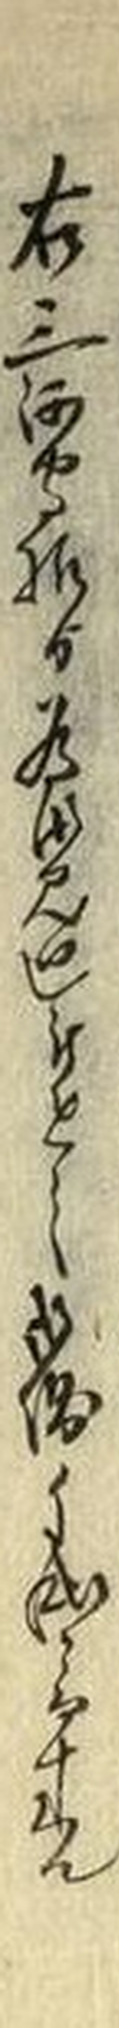右三河守様ゟ為御見廻被進之御側手紙ニ而来ル
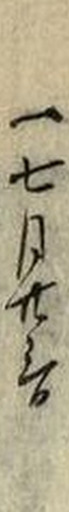一七月廿三日
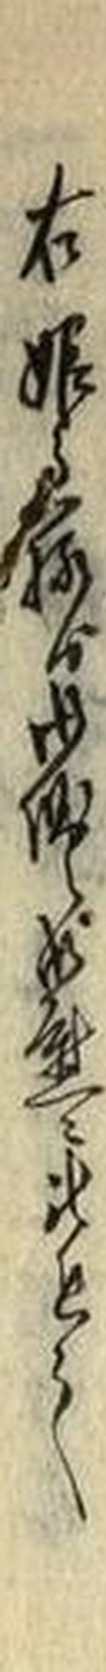右姫君様ゟ御側へ御慰ニ被進之
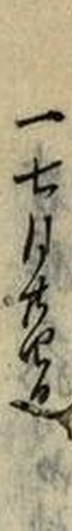一七月廿四日
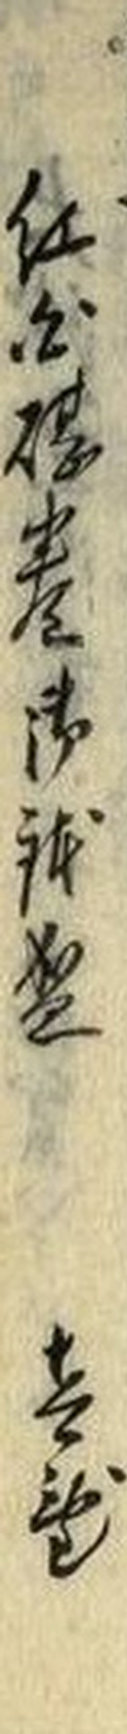紅白碪巻御鉢盛壱台
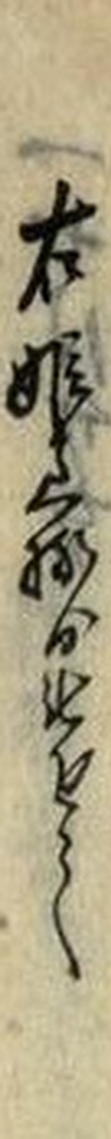右姫君様ゟ被進之

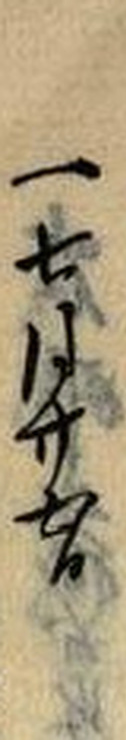一七月廿五日
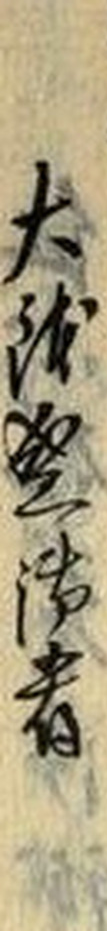御鉢盛御肴
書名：少傅日録抄（斉承付側向頭取日記、在府）
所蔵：福井県文書館 Fukui Prefectural Archives
